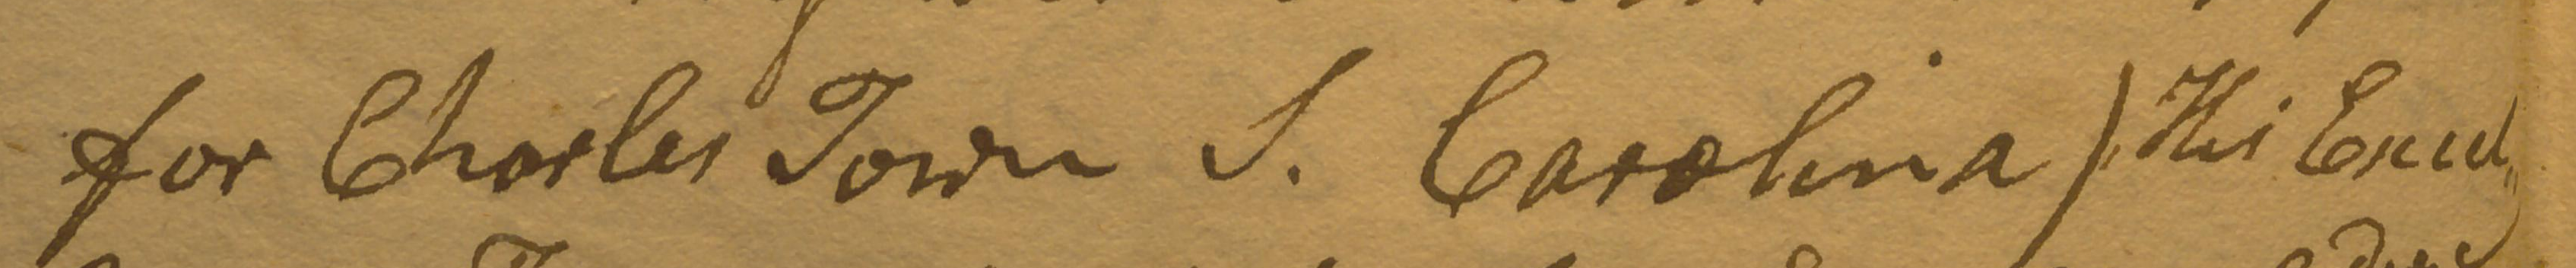for Charles Tom S. Carolina ) This Excely
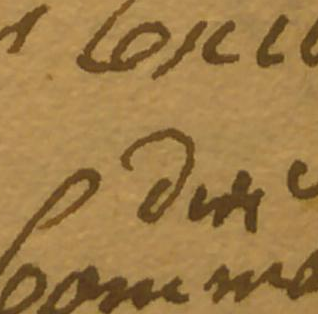dir
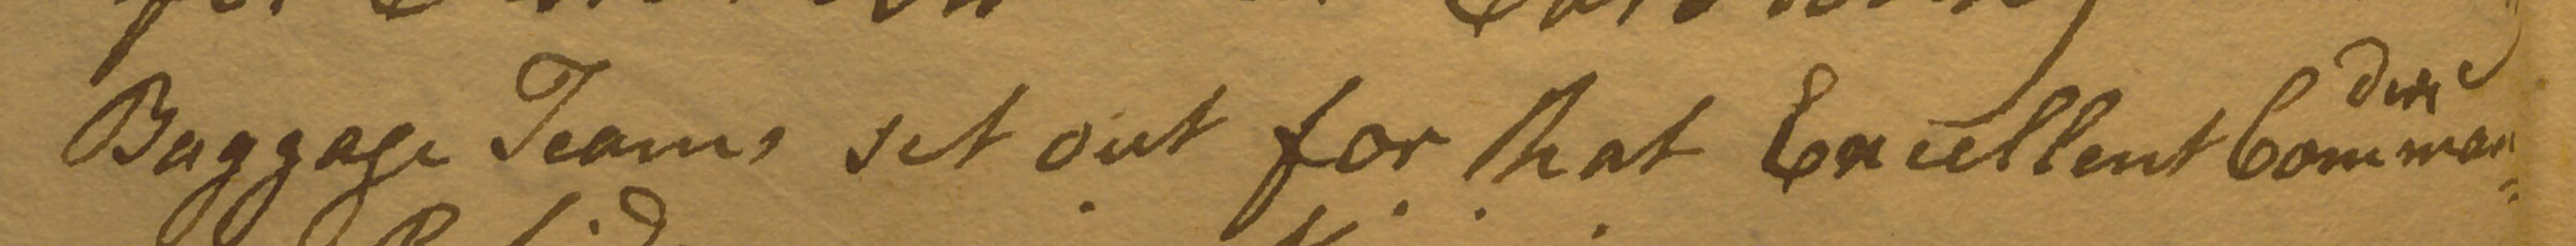Baggage Teams set out for that Excellent Comman^der
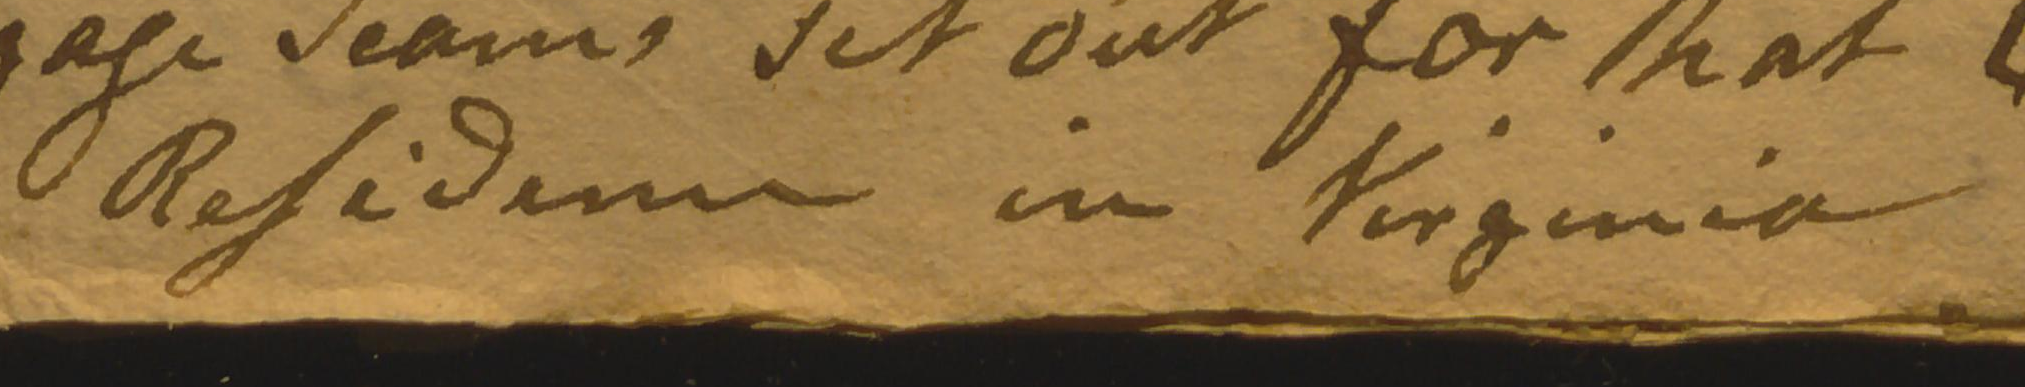Residence in Virginia
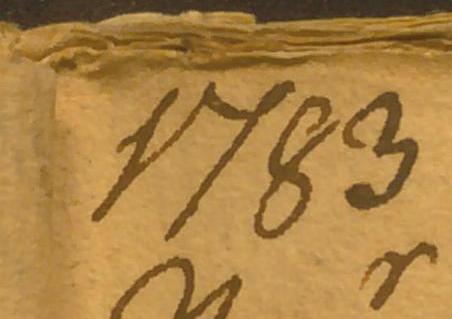1783
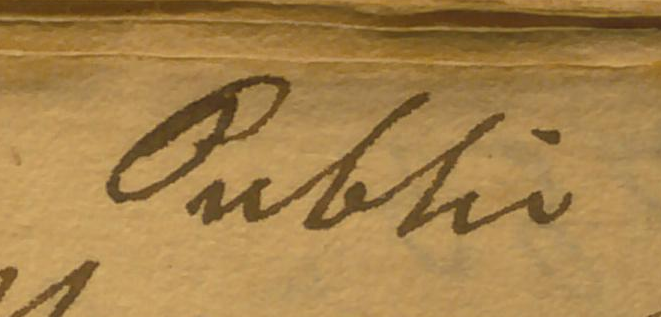Public
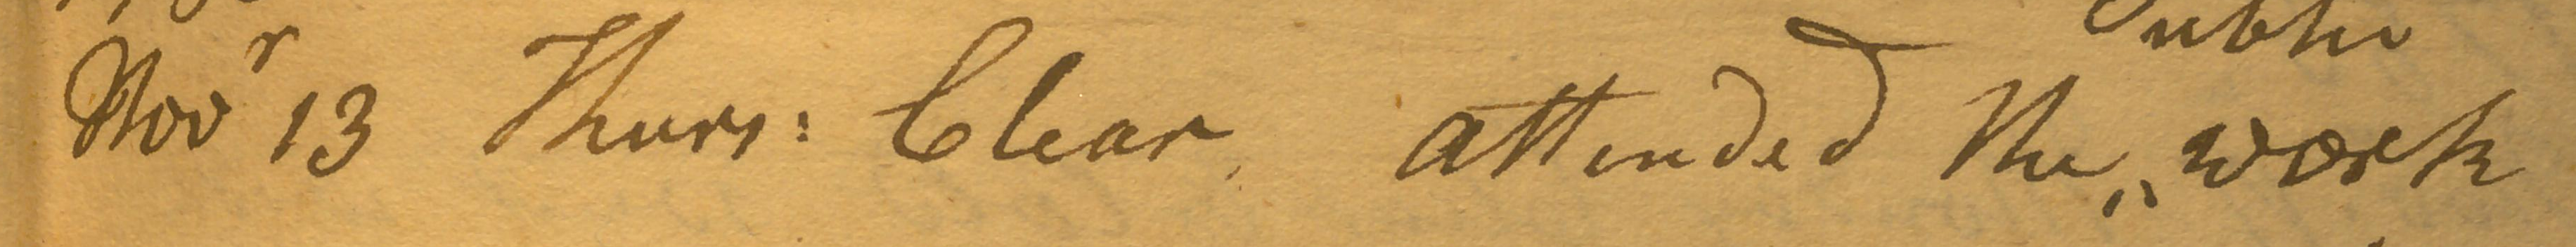Nov^r 13 Thurs: Clear, attended the ^ work
